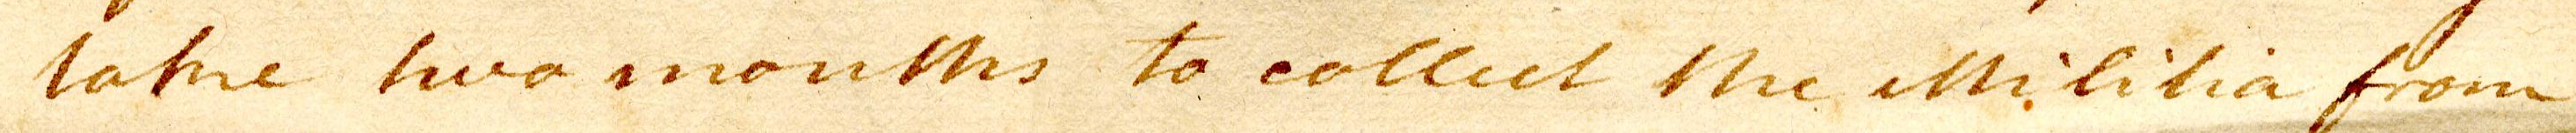take two months to collect the Militia from
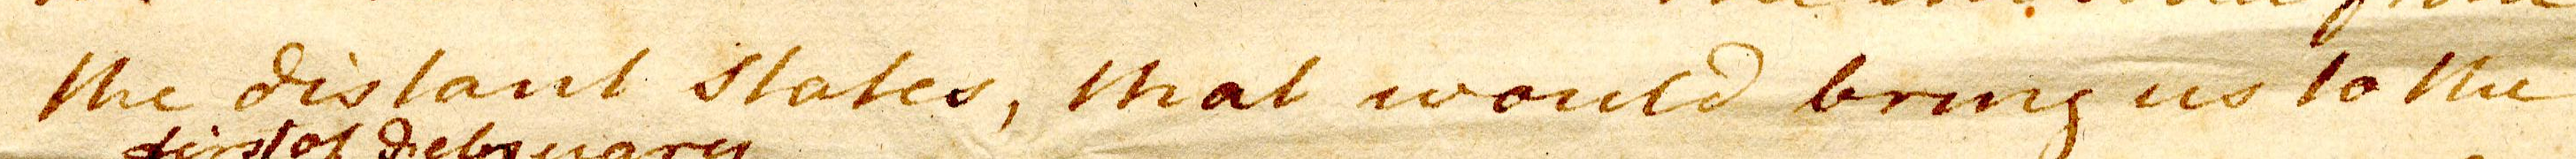the distant states, that would bring us to the
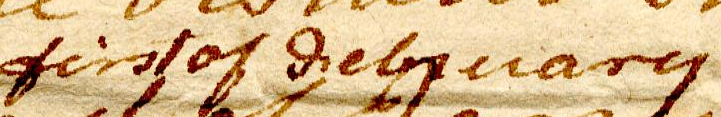first of February
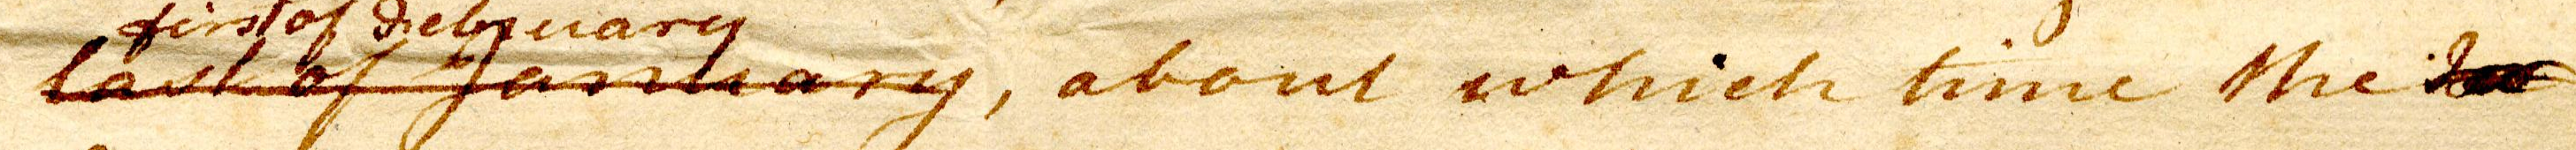[last of January], about which time the [___]
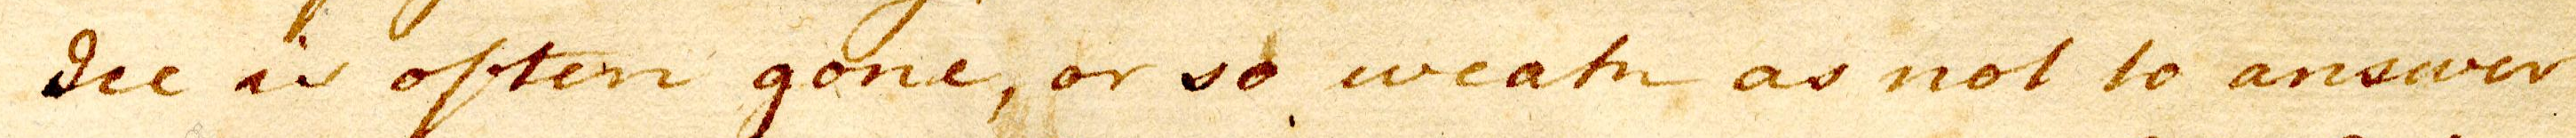Tee is often gone, or so weak as not to answer
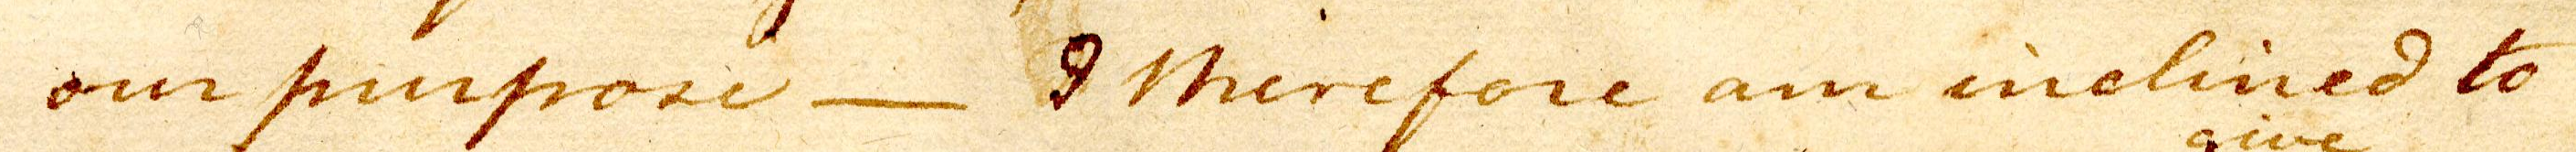our purpose- I therefore am inclined to
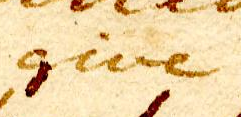give
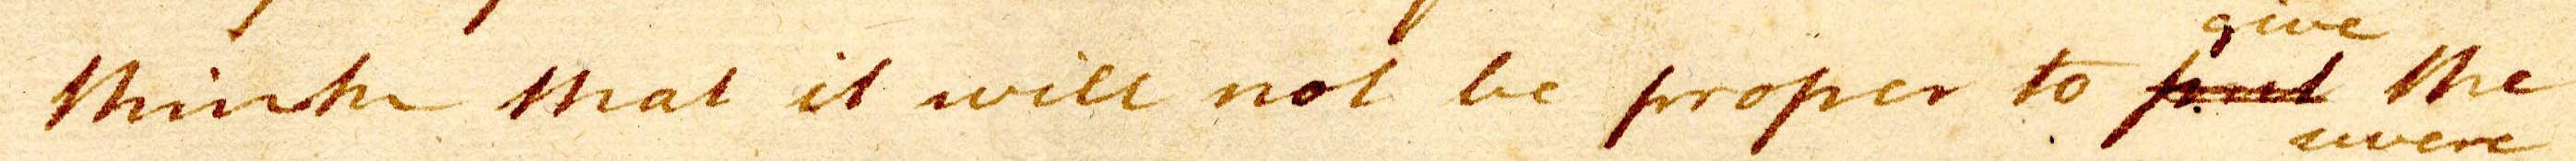think that it will not be proper to [put] the
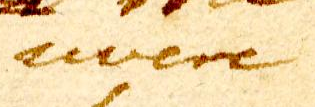severe
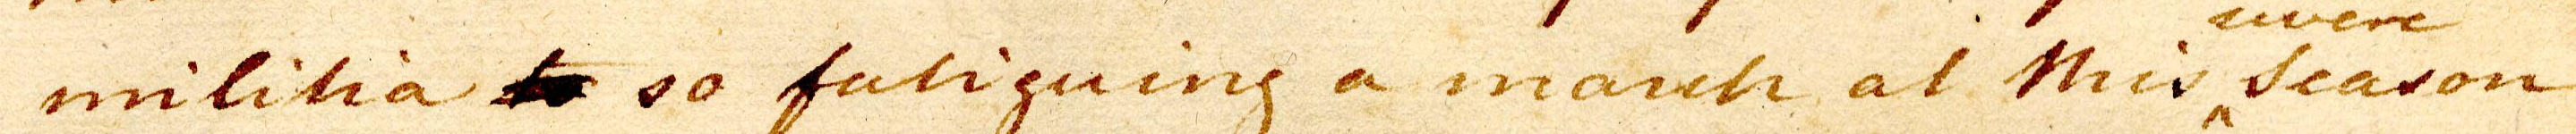militia to so fatiguing a march at this season
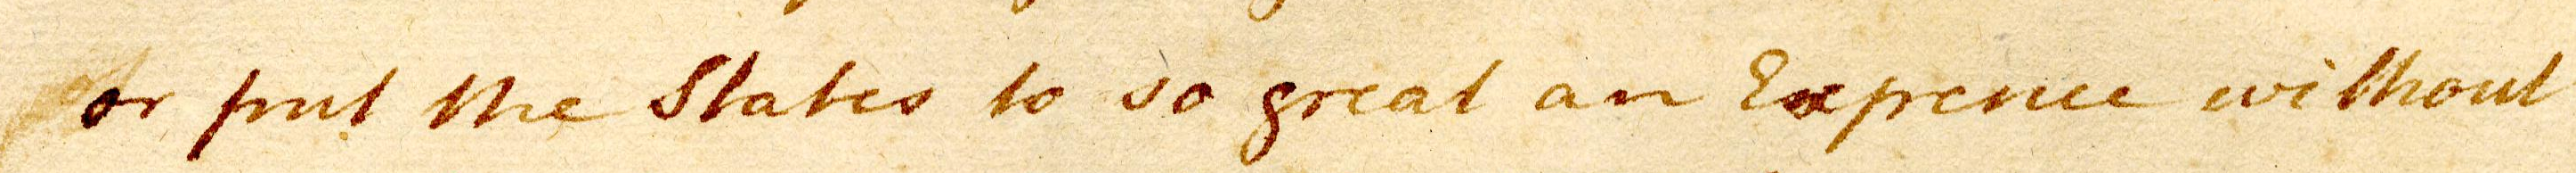or put the States to so great an Expence without
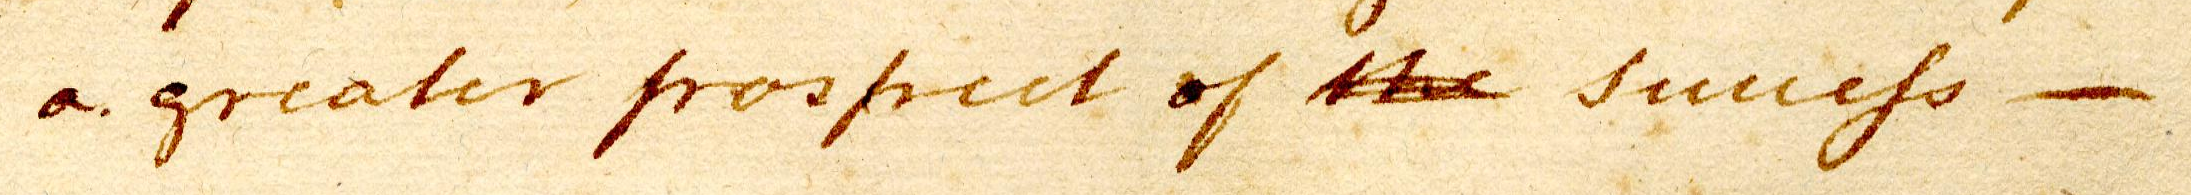a greater prospect of [the] success-
